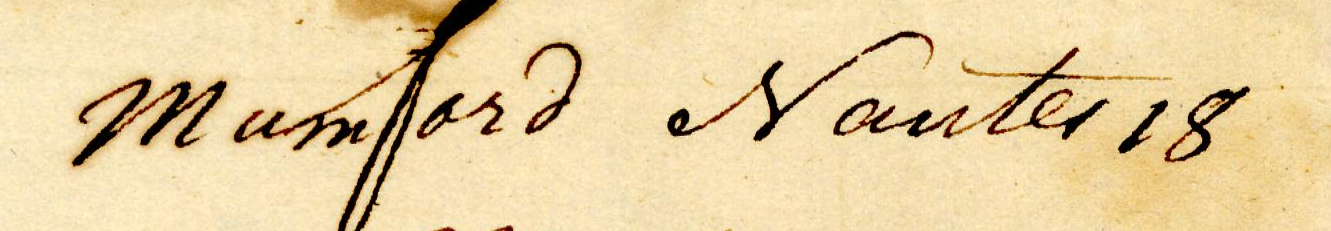Mumford Nantes 18
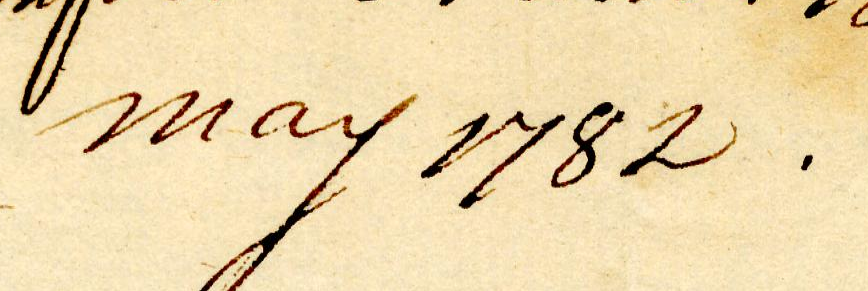May 1782.
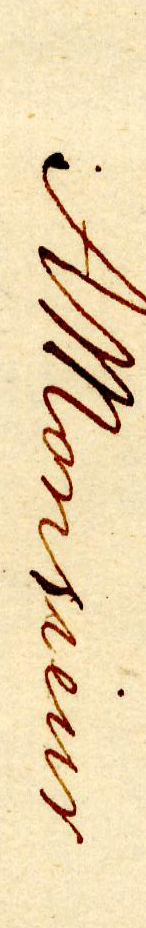A Monsieur
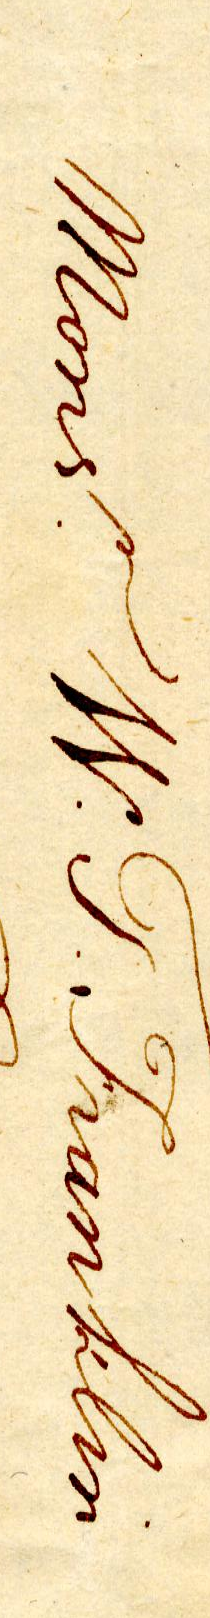Mons^r. W. T. Franklin
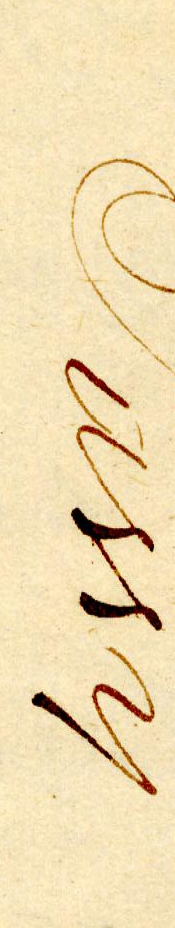Passy
